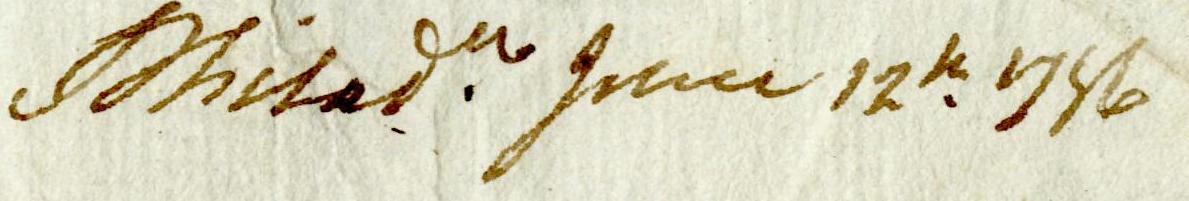Philad^a. June 12^th. 1786
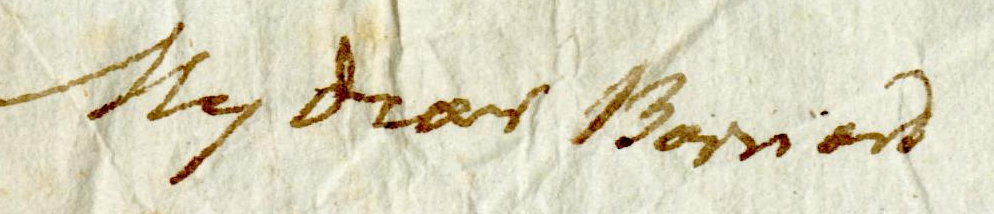My Dear Barnard
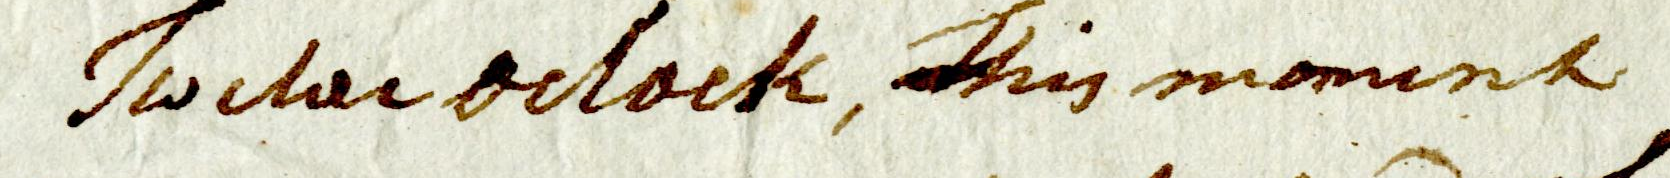Twelve oclock, This moment
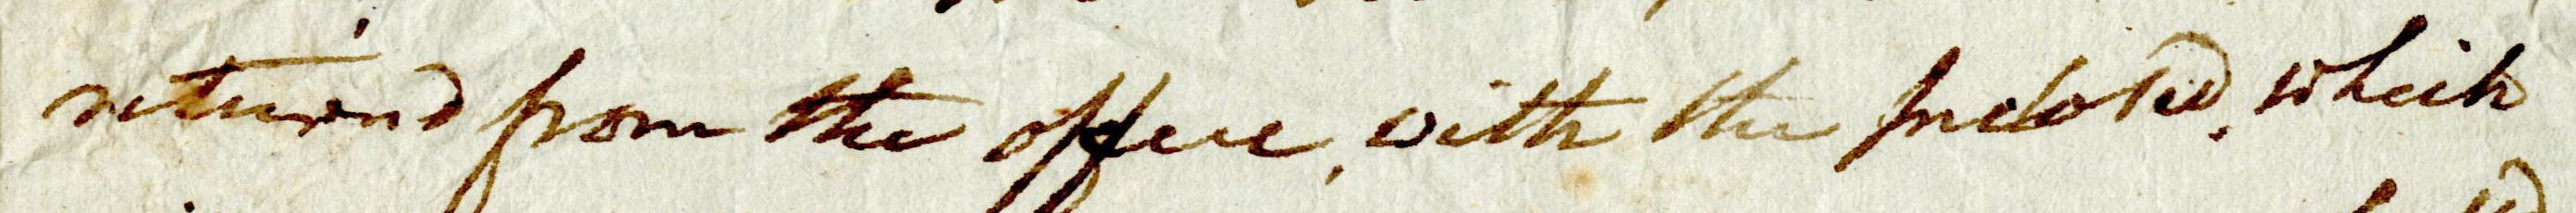return'd from the offece with the Inclosed which
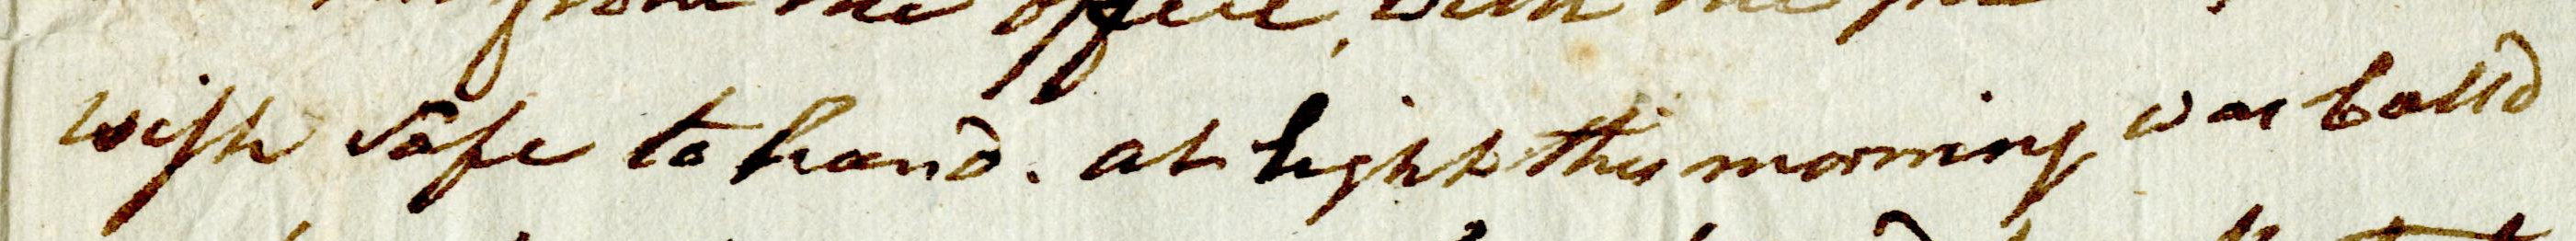wish safe to hand. at light this morning was Calld
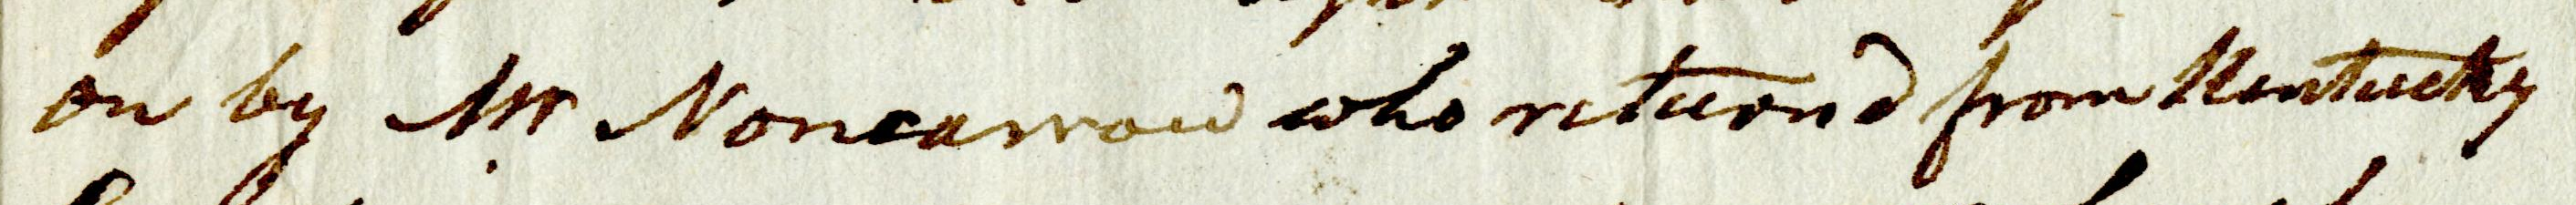on by Mr Noncarrow who returnd from Kentucky
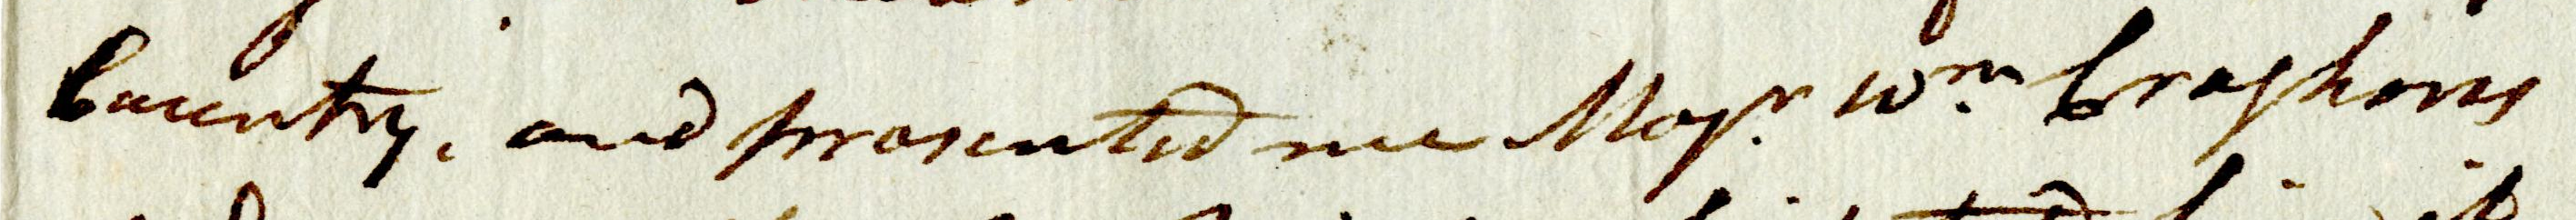Country. and presented me Maj^r. W^m. Craghons
